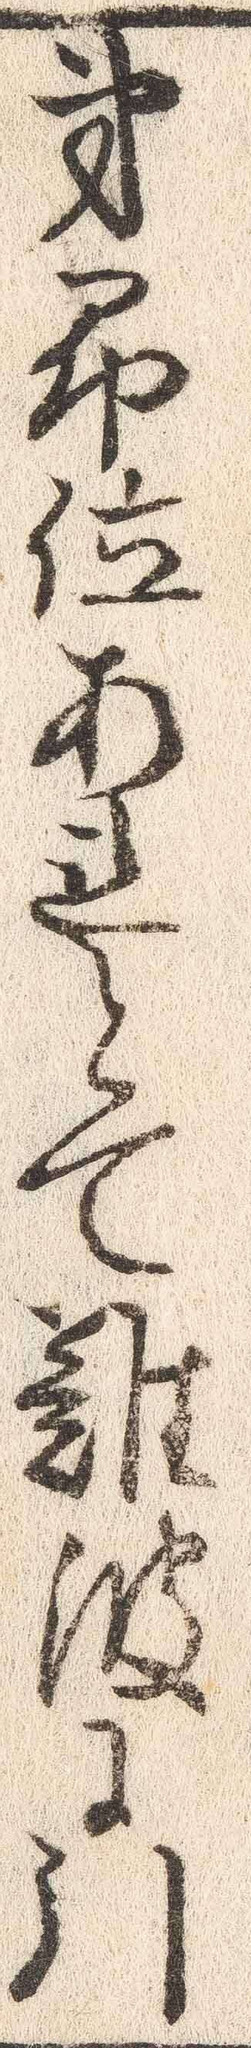弟即位あれとて誰彼に引
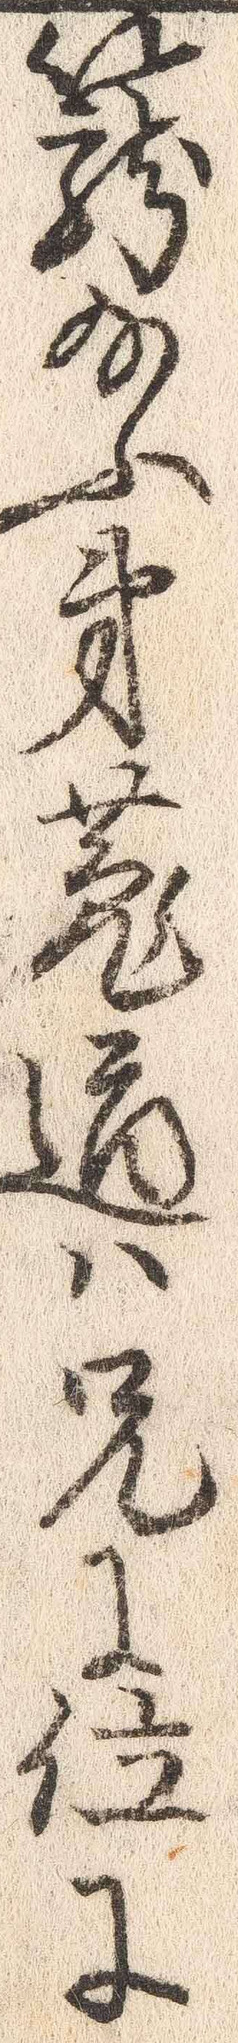籠給ふ弟菟道は兄に位に
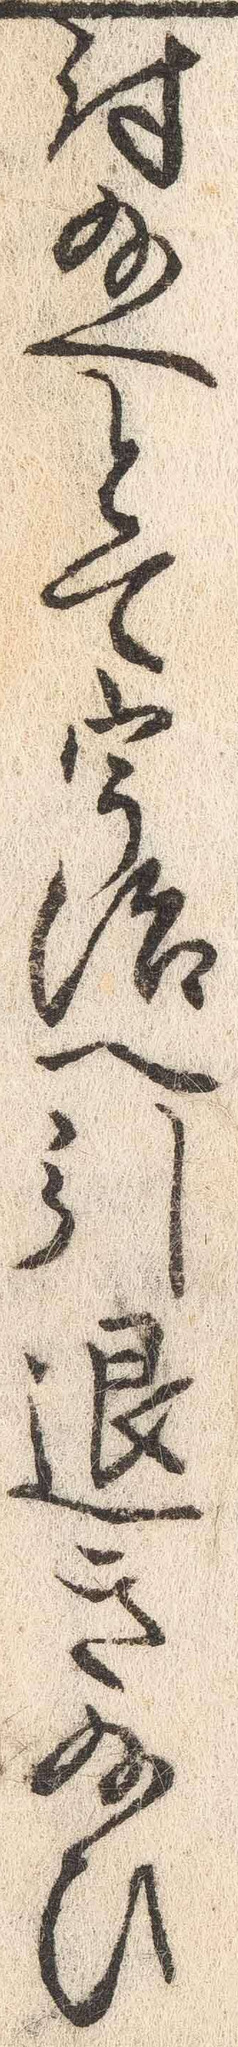付給へとて宇治へ引退き給ひ

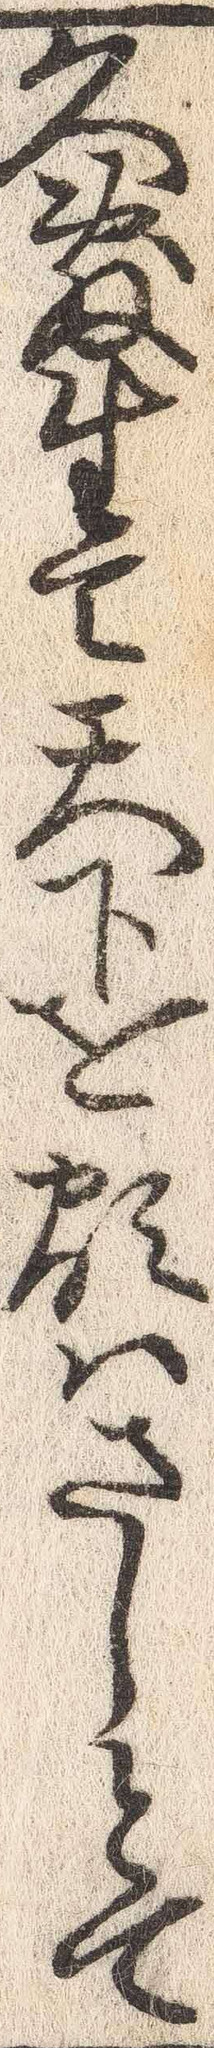久敷生て天下を煩はさしとて
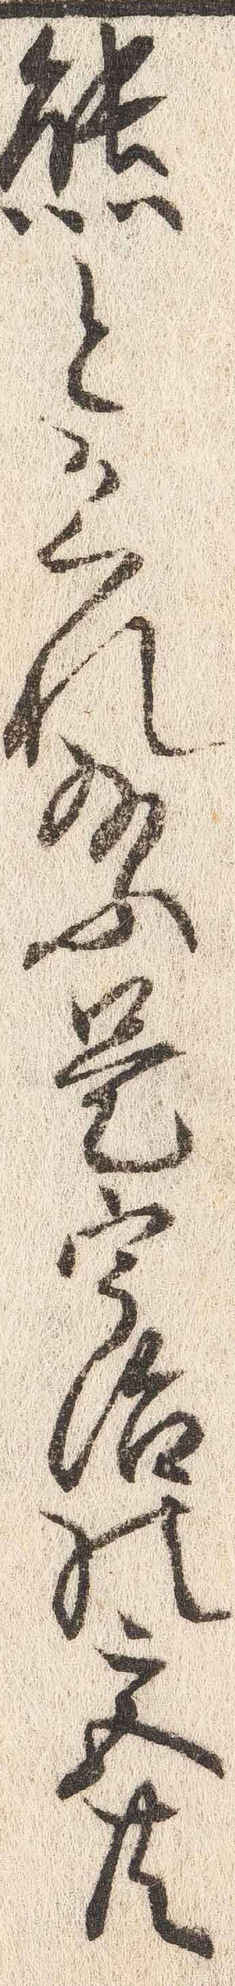然とかくれ給ふ是宇治の宮共
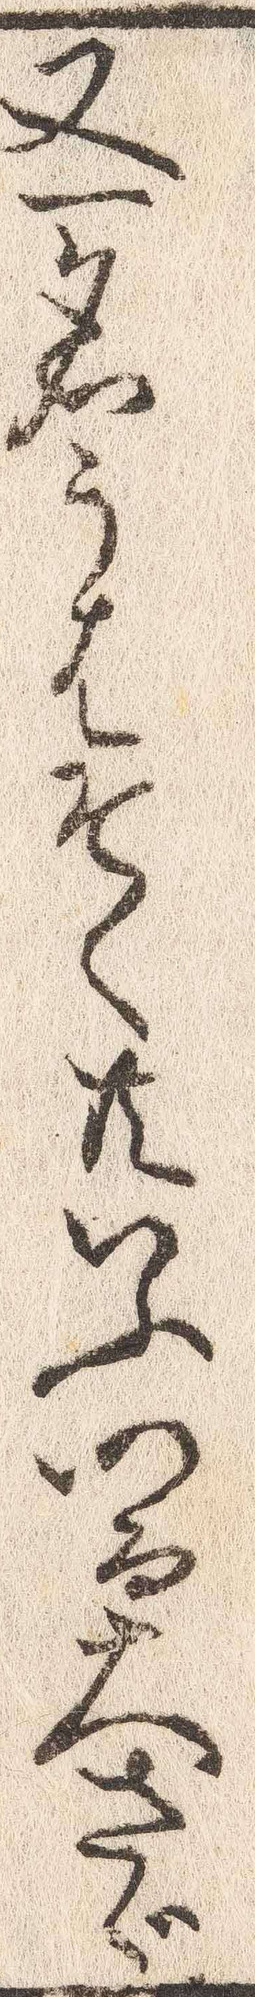又一名うはそく共いふ以而大さゞ
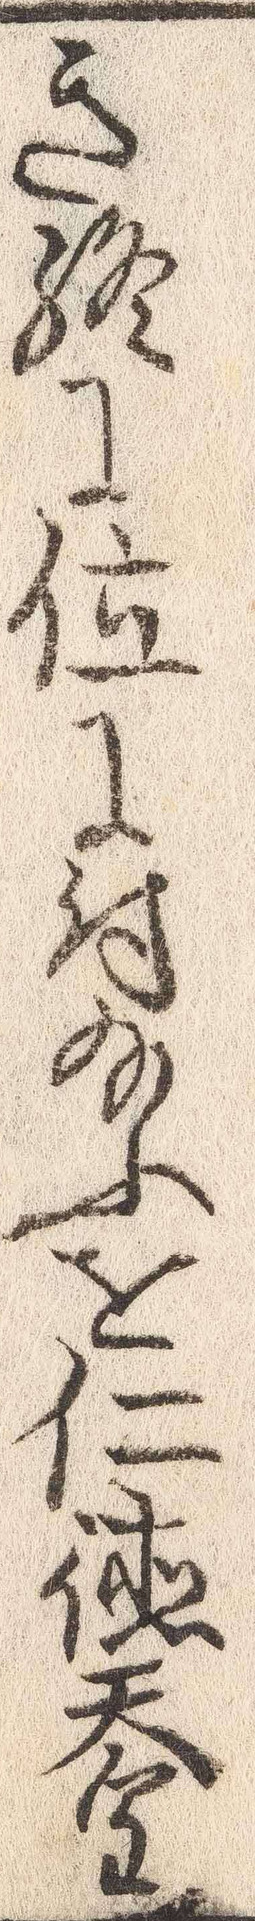き終に位に付給ふを仁徳天皇
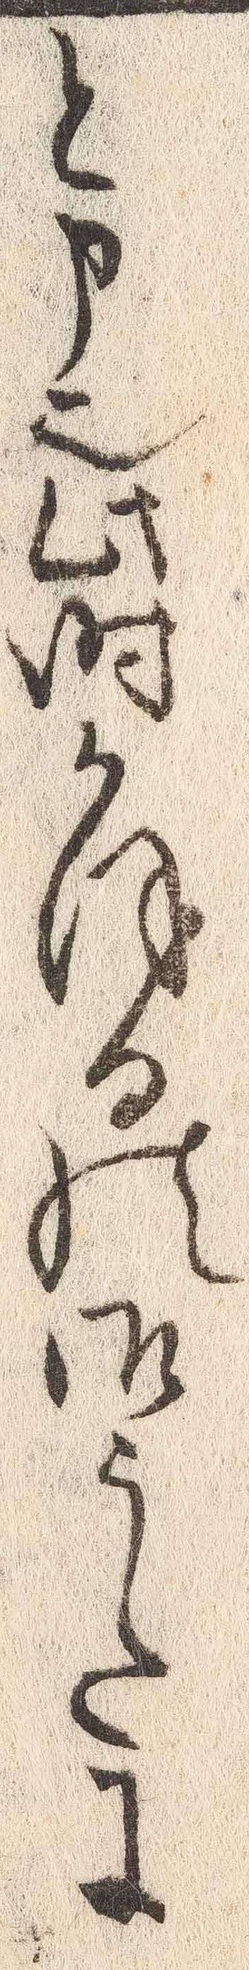と申也此時かほるの御うたに
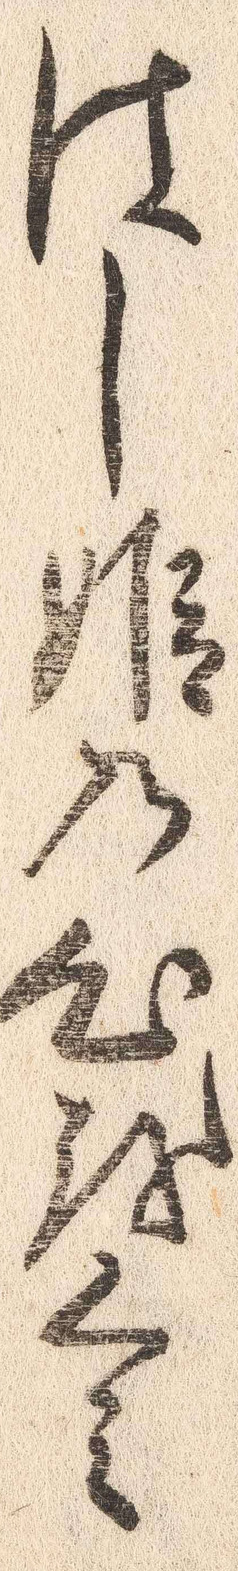はし姫の心をくみ
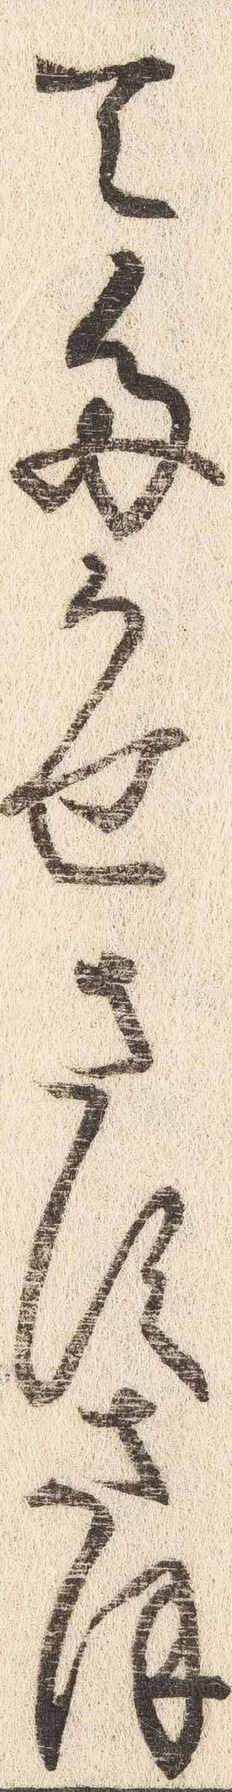てたかせさすさほ
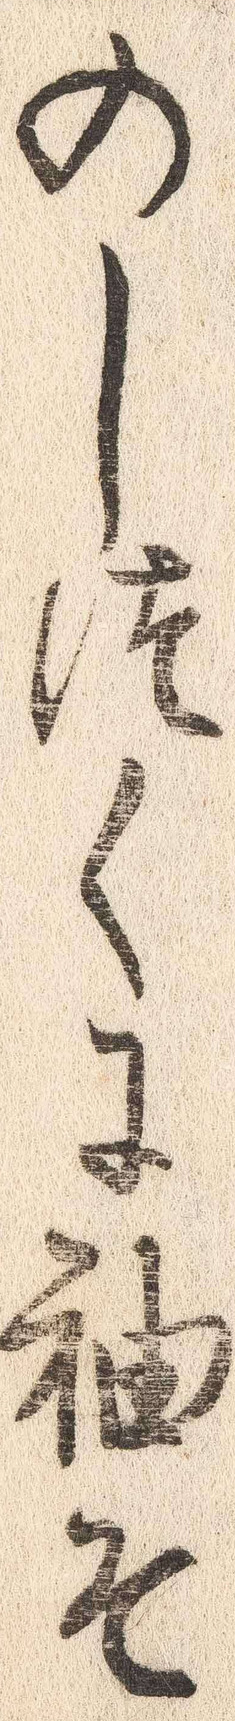のしつくに袖そ

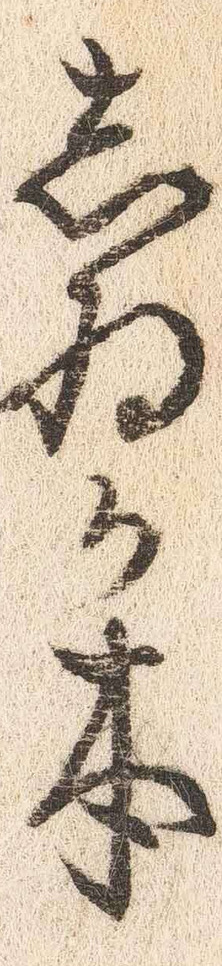しゐか本
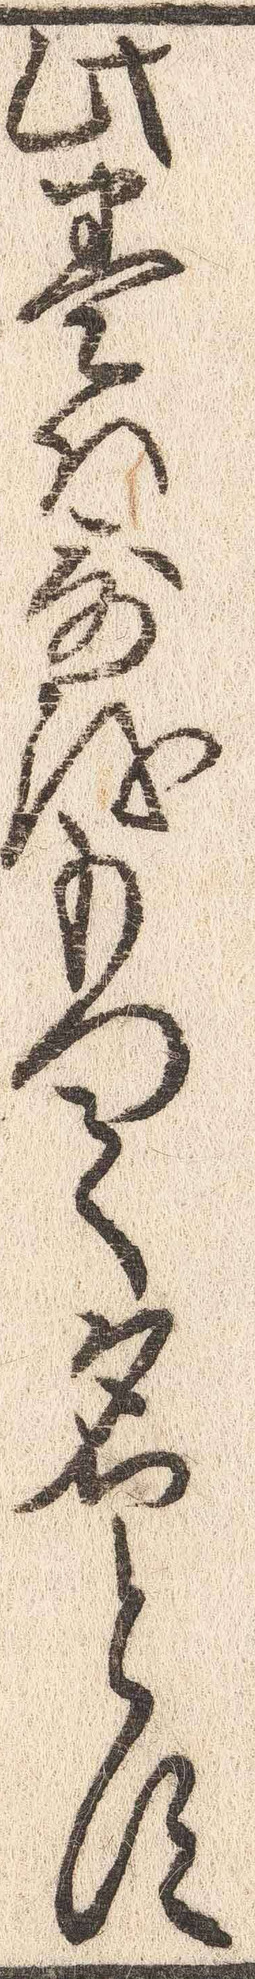此巻は歌をもつて名とす
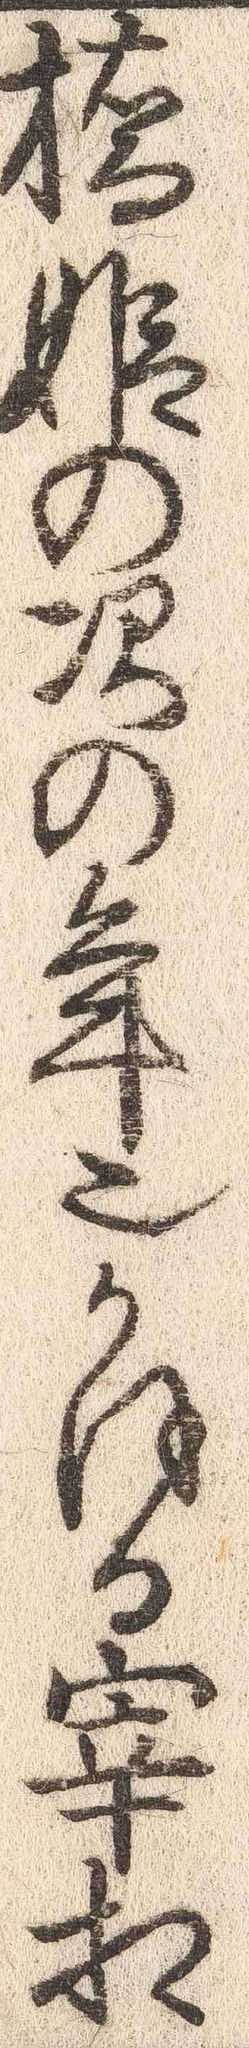橋姫の次の年也かほる宰相
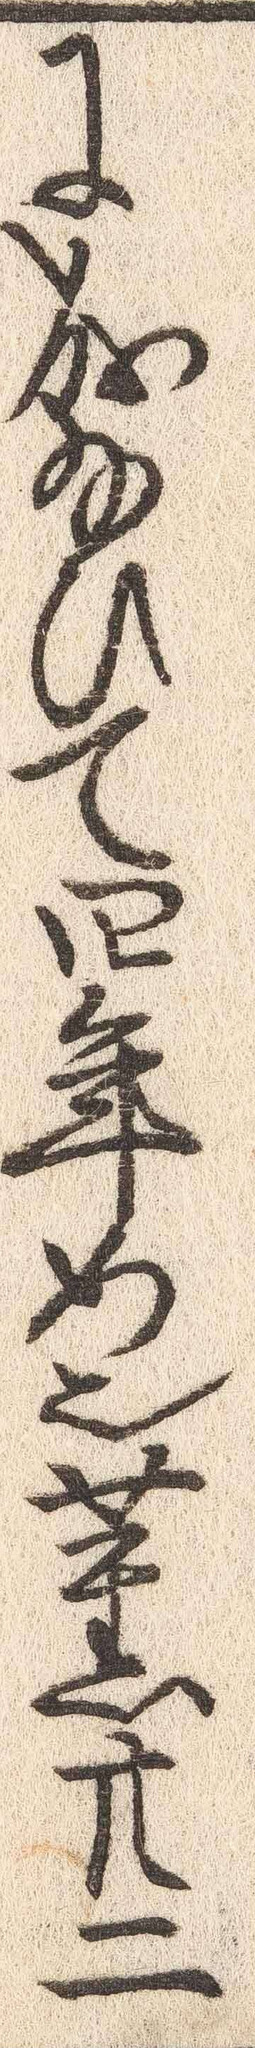に成給ひて四年め也薫廿二
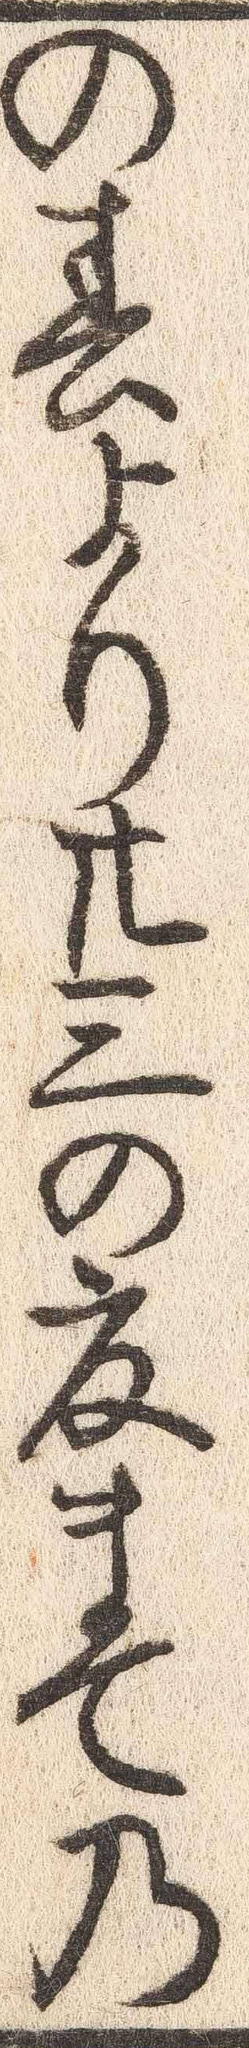の春より廿三の夏まての
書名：源氏物語
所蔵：東京学芸大学附属図書館 国文学研究資料館
